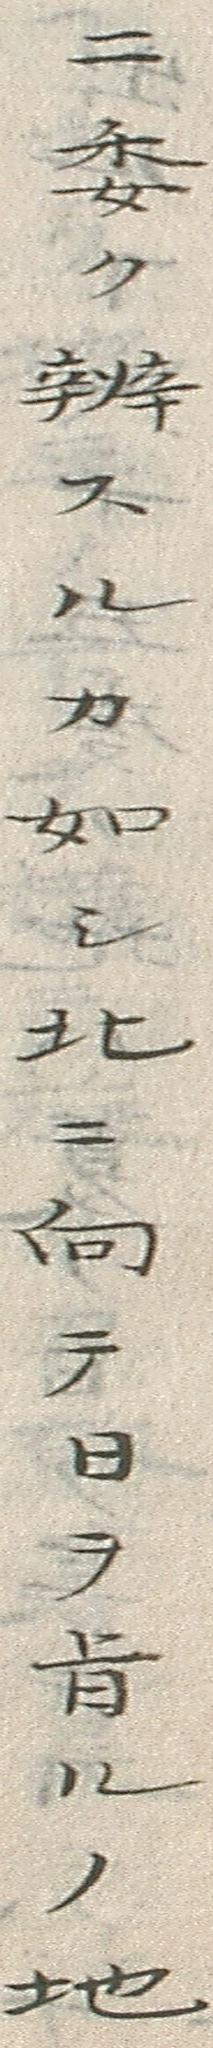ニ委ク弁スルカ如シ北ニ向テ日ヲ旨ルノ地
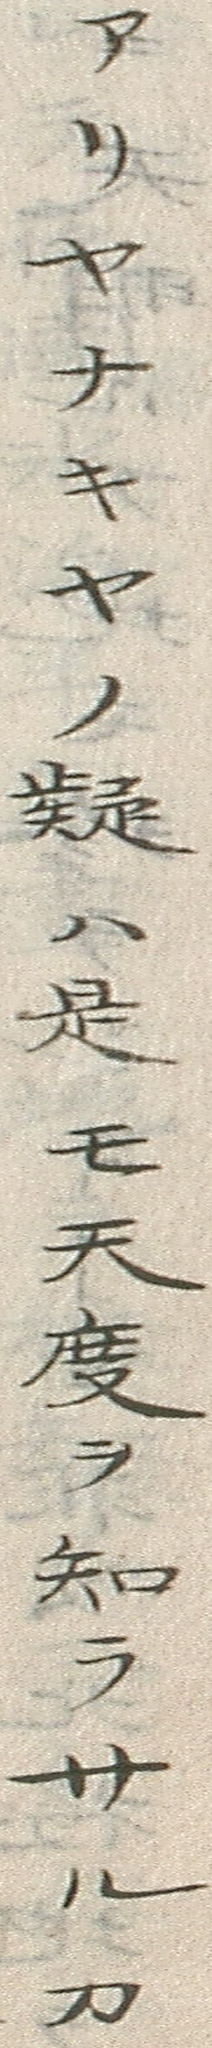アリヤナキヤノ疑ハ是モ天度ヲ知ラサルカ
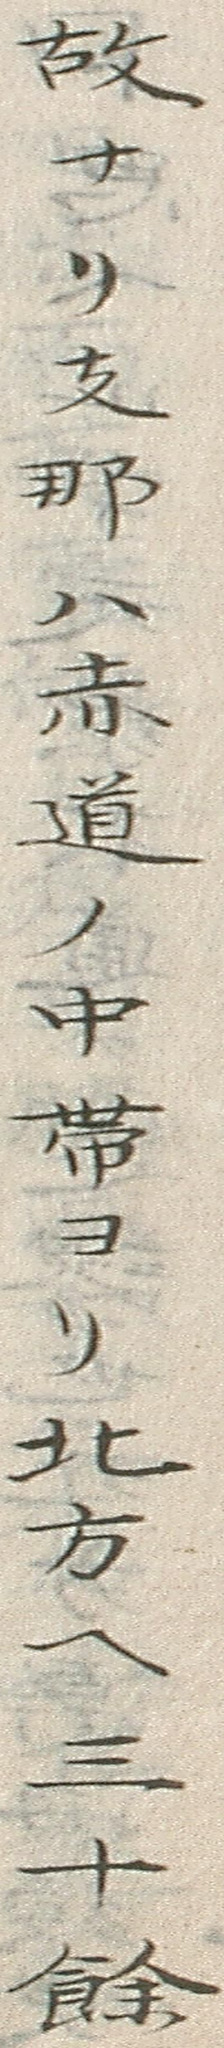故ナリ支那ハ赤道ノ中帯ヨリ北方ヘ三十余
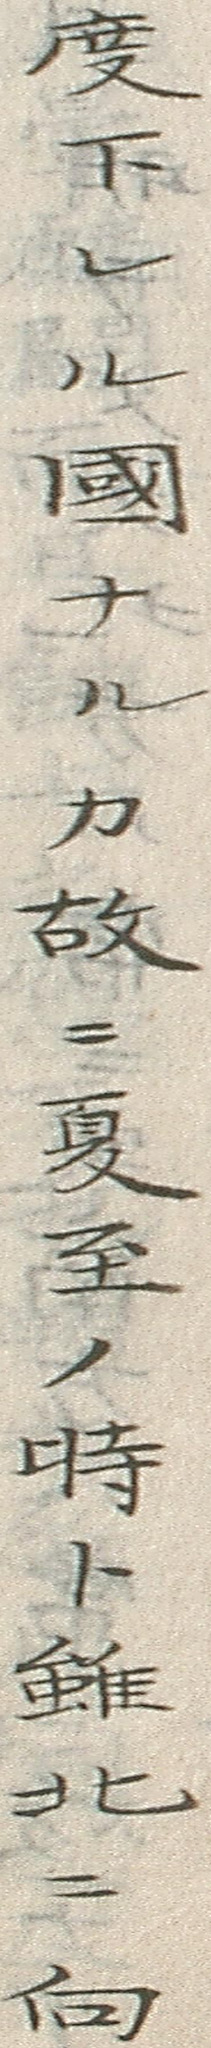度下レル国ナルカ故ニ夏至ノ時ト雖北ニ向
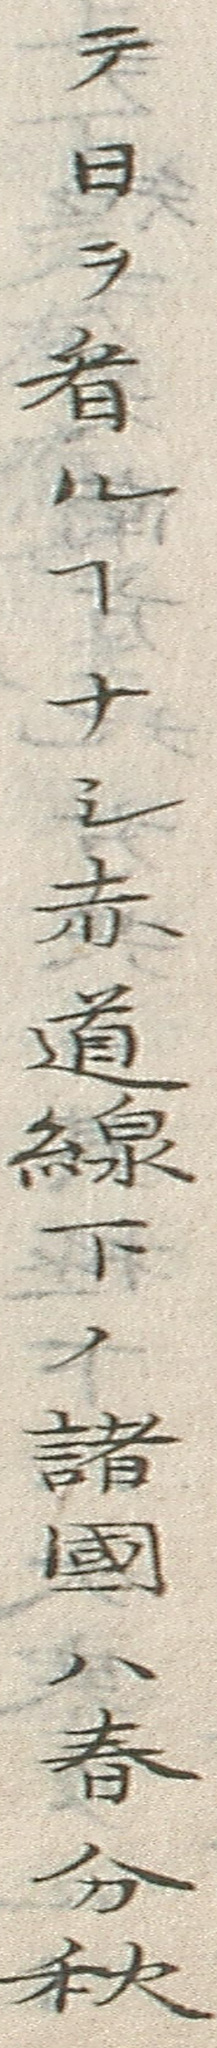テ日ヲ看ルコトナシ赤道線下ノ諸国ハ春分秋
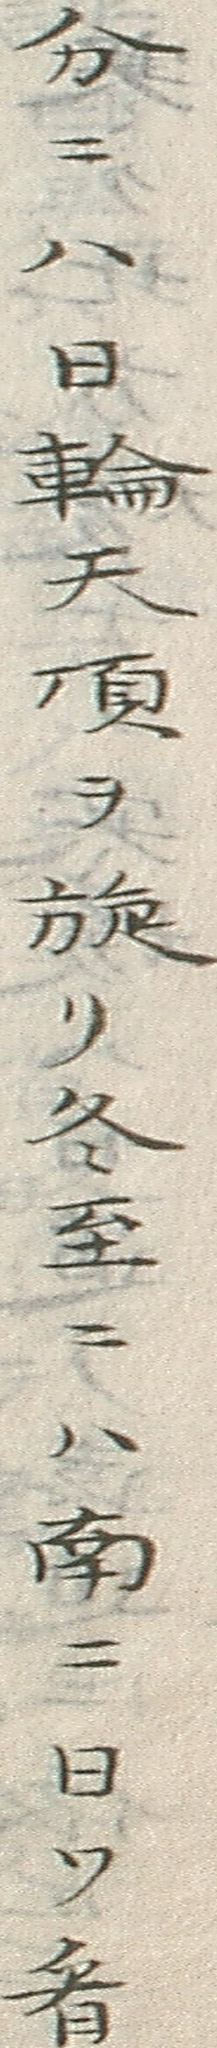分ニハ日輪天頂ヲ旋リ冬至ニハ南ニ日ソ看
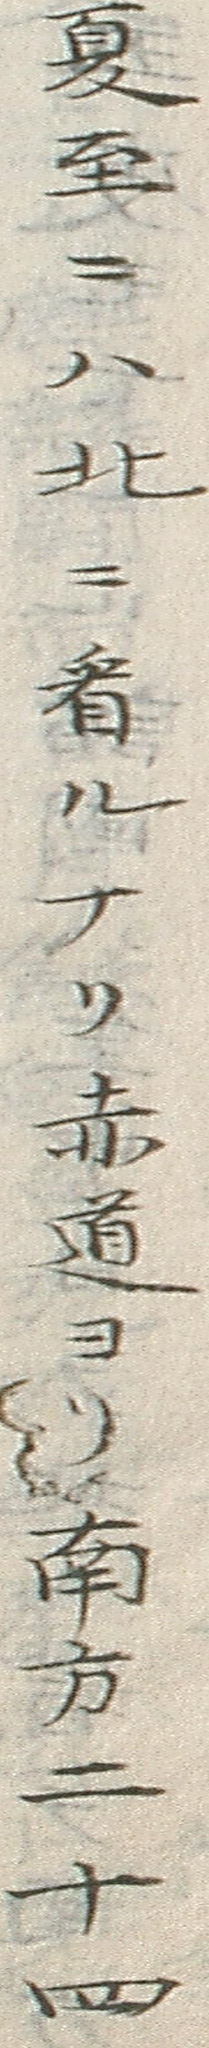夏至ニハ北ニ看ルナリ赤道ヨリ南方二十四

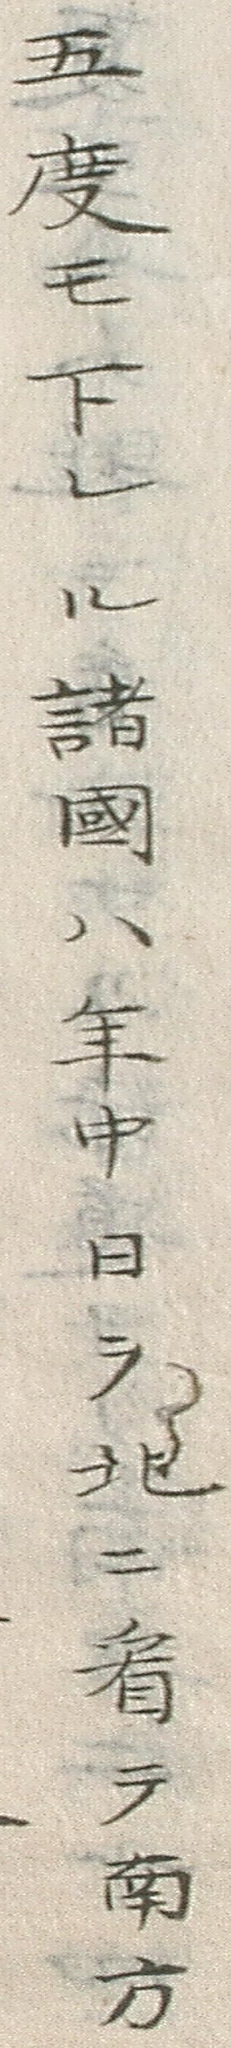五度モ下レル諸国ハ年中日ヲ北ニ看テ南方
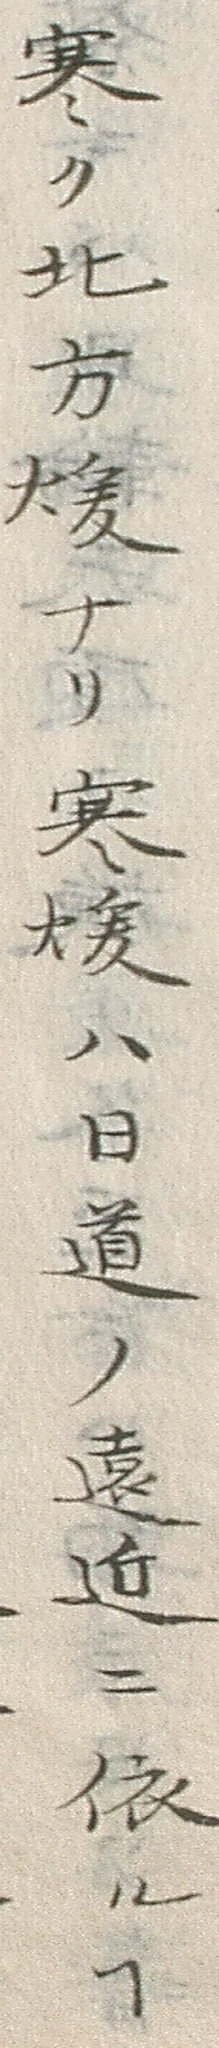寒ク北方煖ナリ寒煖ハ日道ノ遠近ニ依ルコト
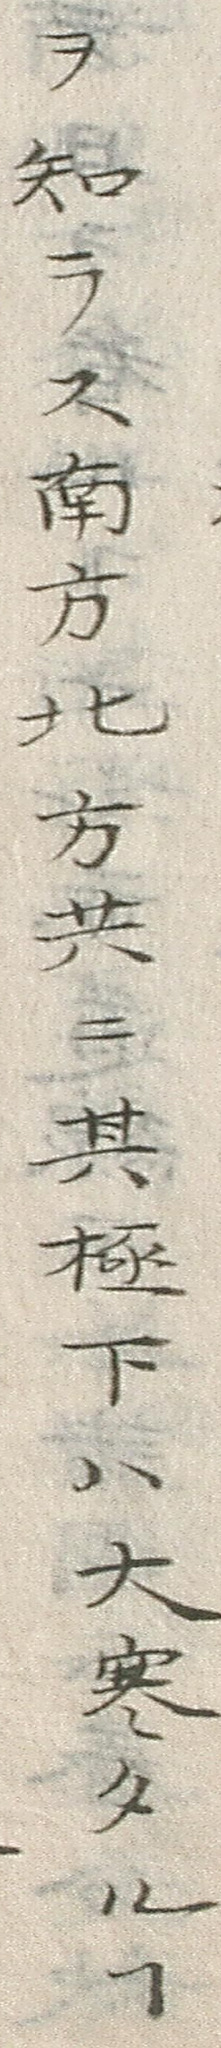ヲ知ラス南方北方共ニ其極下ハ大寒タルコト
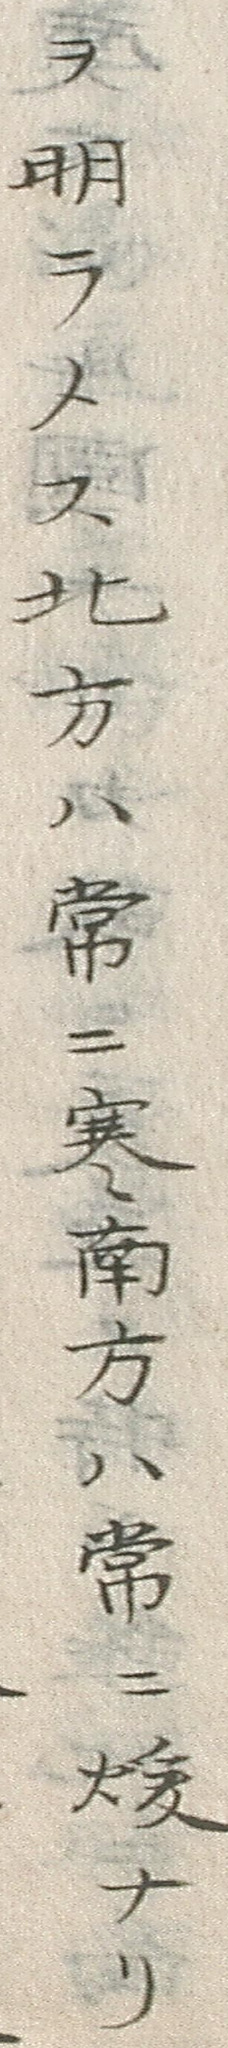ヲ明ラメス北方ハ常ニ寒南方ハ常ニ煖ナリ
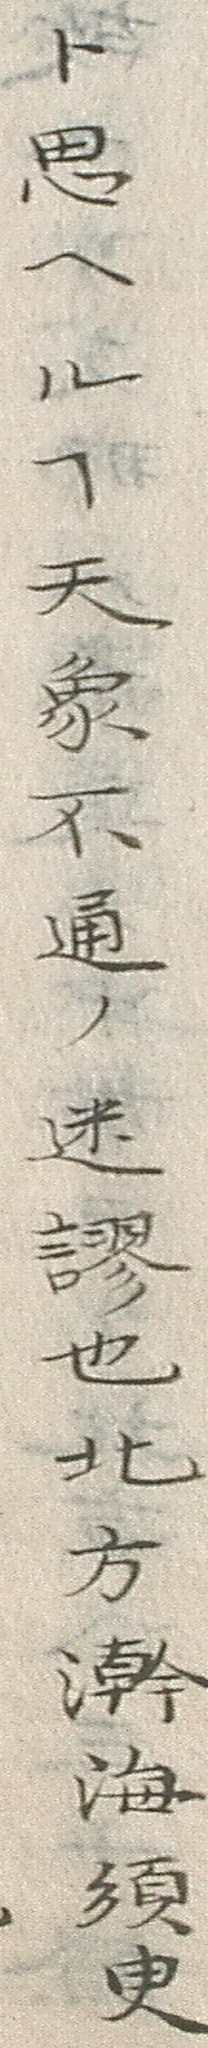ト思ヘルコト天象不通ノ迷謬也北方澣海須曳
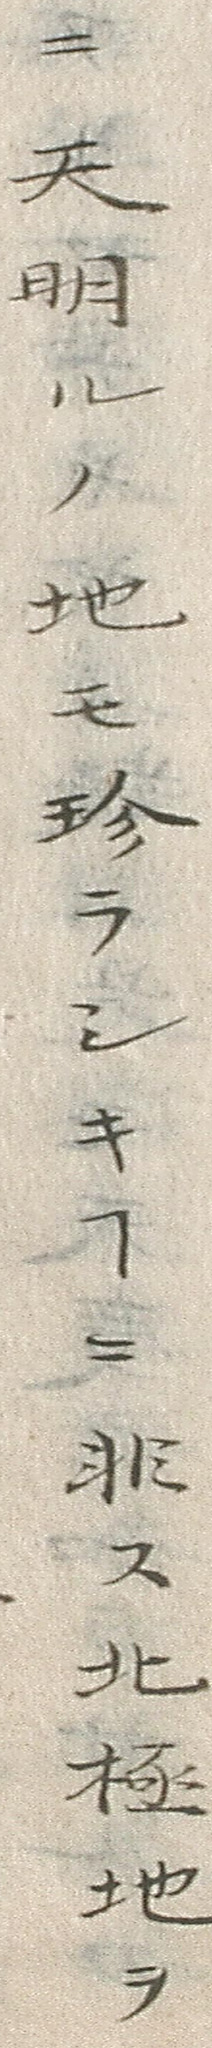ニ天明ルノ地モ珍ラシキコトニ非ス北極地ヲ
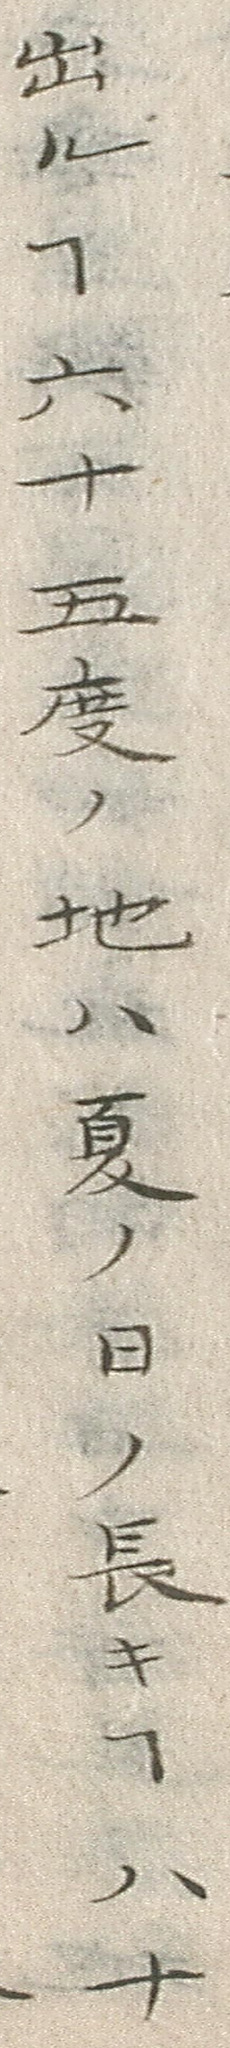出ルコト六十五度ノ地ハ夏ノ日ノ長キコトハ十
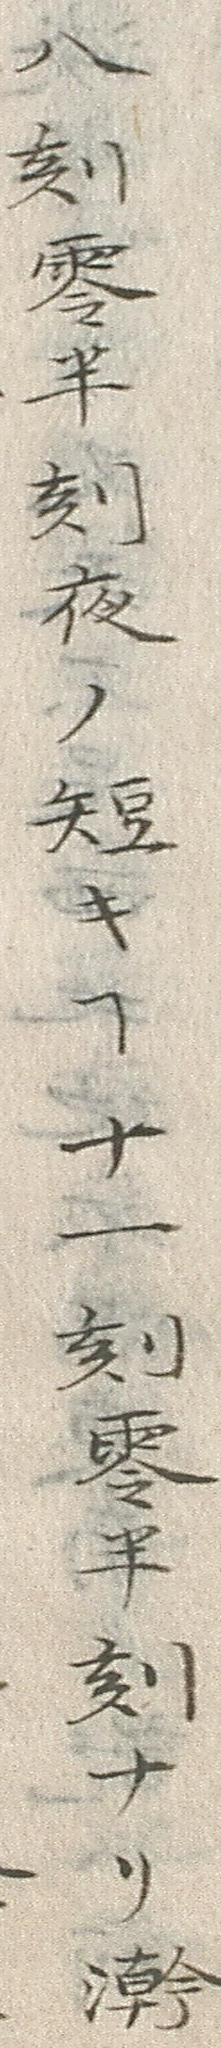八刻零半刻夜ノ短キコト十一刻零半刻ナリ澣
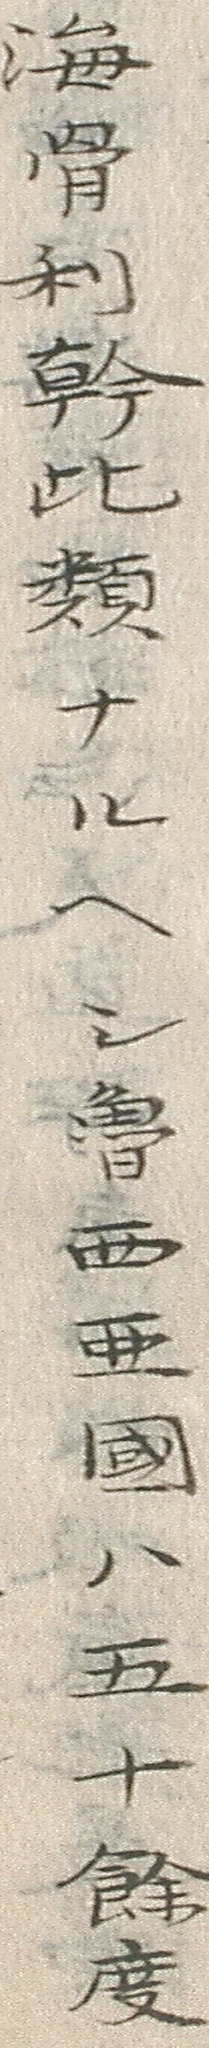海骨利幹比類ナルヘシ魯西亜国ハ五十余度
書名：天學略名目羽翼　全
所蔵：東京大学地震研究所図書室 Earthquake Research Institute Library, The University of Tokyo, JAPAN
